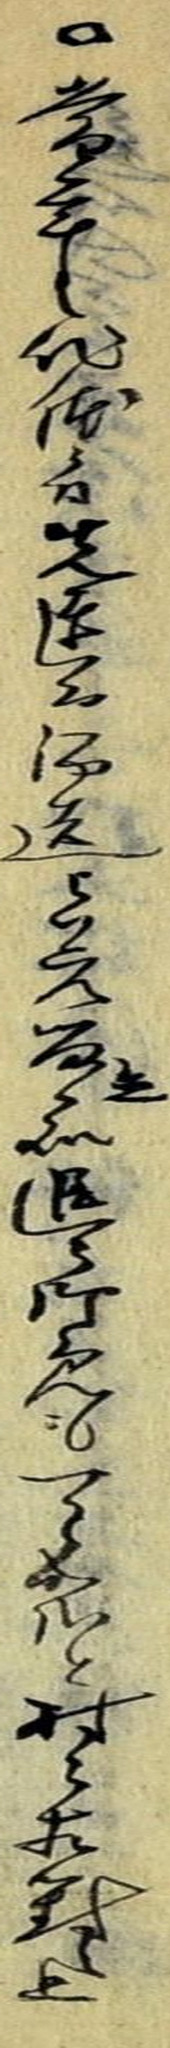○当年之作体ニ付先達而酒造被差留置候処追々御免も可被成哉と村々相対之上
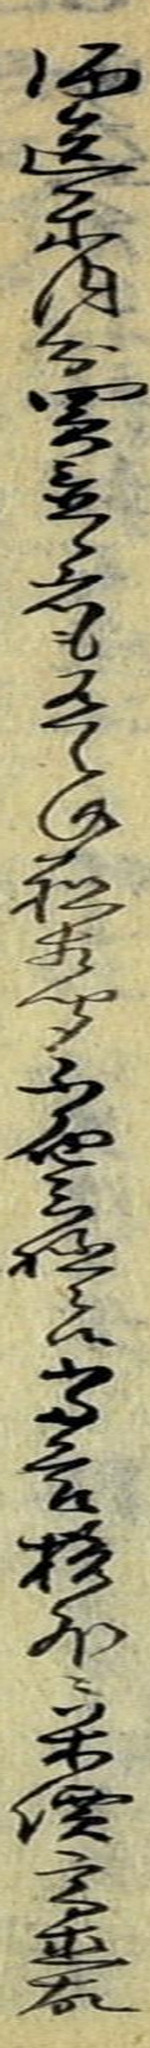酒造米内分買置候も有之趣粗相聞不届至極ニ候当節格外ニ米価高直故
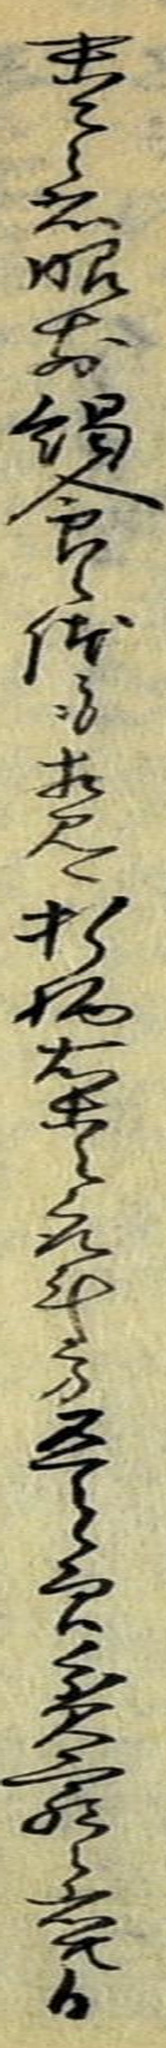末々之者眼前竭食候体ニも相見へ折柄右等之取計方有之候而ハ貧窮之者共自
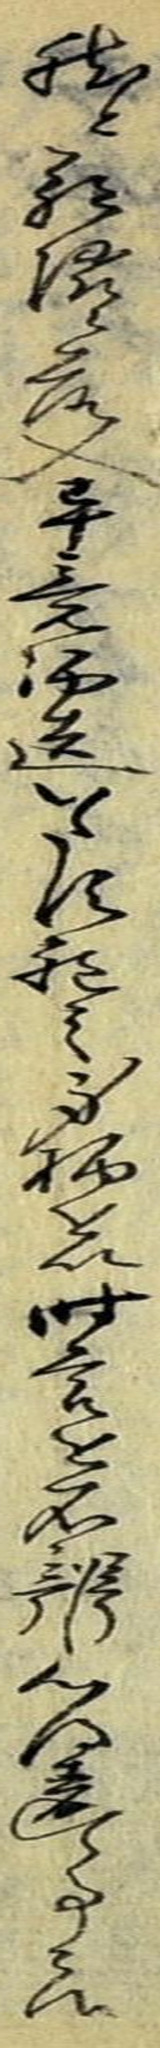然と難渋ニ落入畢竟酒造いたす程之身柄を以時節を不弁心得違之事ニ候
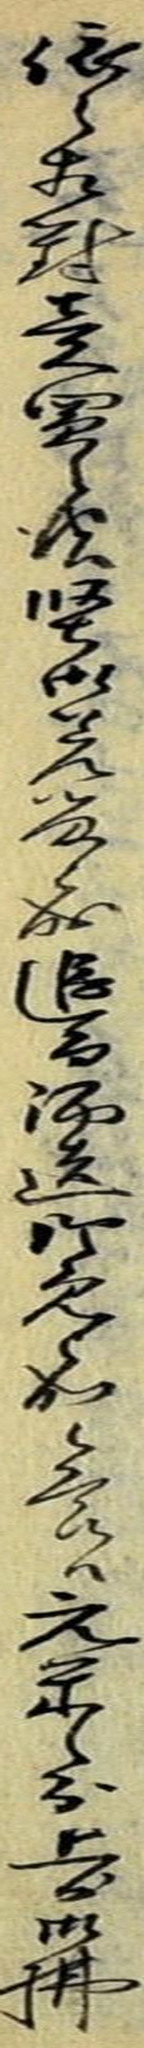依之相対売買之儀堅御差留被成追而酒造御免被成候節ハ元米之分上ゟ御払
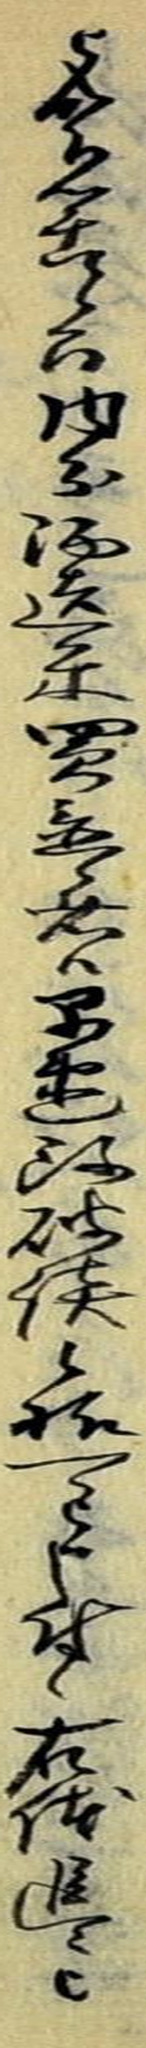被成下筈候間内分酒造米買置候者ハ早速致破談候様可被申付候右体追々被
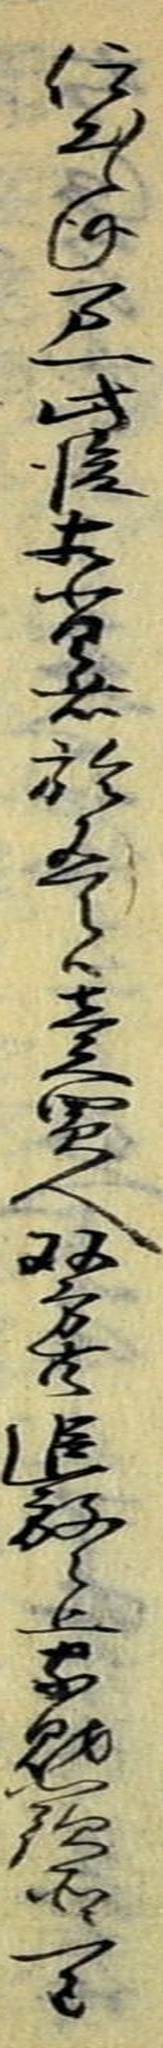仰出候趣万一此後相背者於有之ハ売買人双方共追放之上家財闕所ニ可被
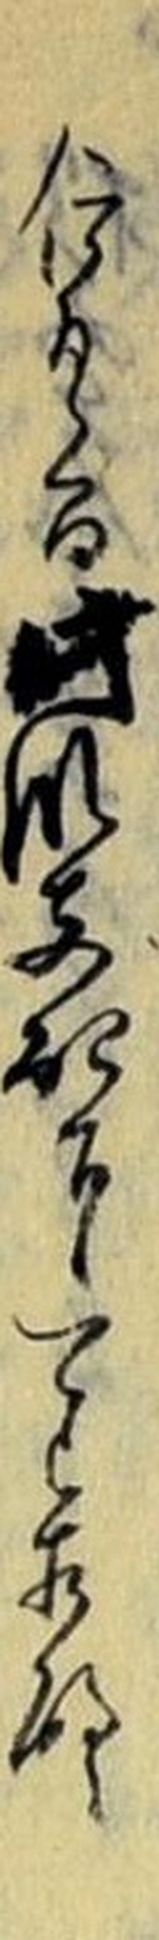仰付候間此段支配下可被相触候
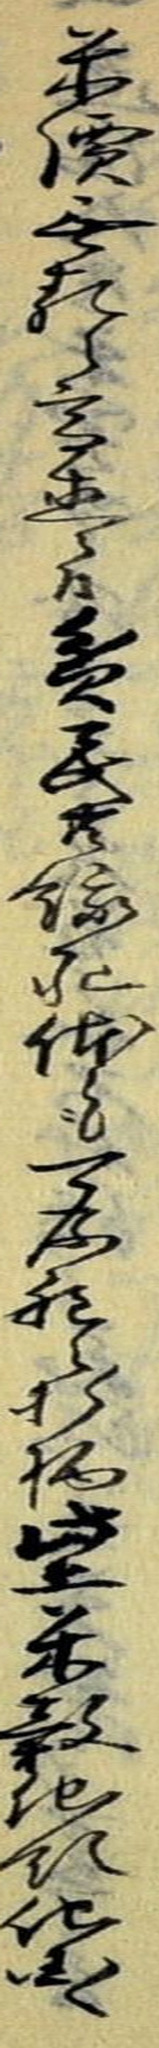○米価無類之高直ニ付貧民共餓死体候も可及程之折柄此上米穀他領他国へ
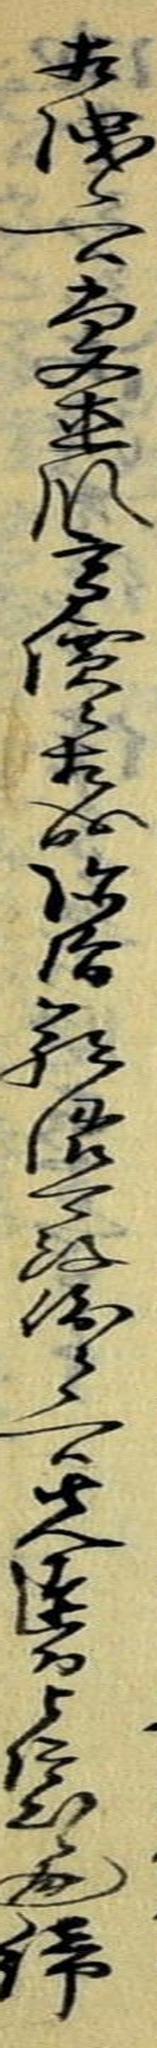相洩候へハ尚又直段高価ニ相成弥増難渋可致儀ニ候へハ先達而被仰出候通締
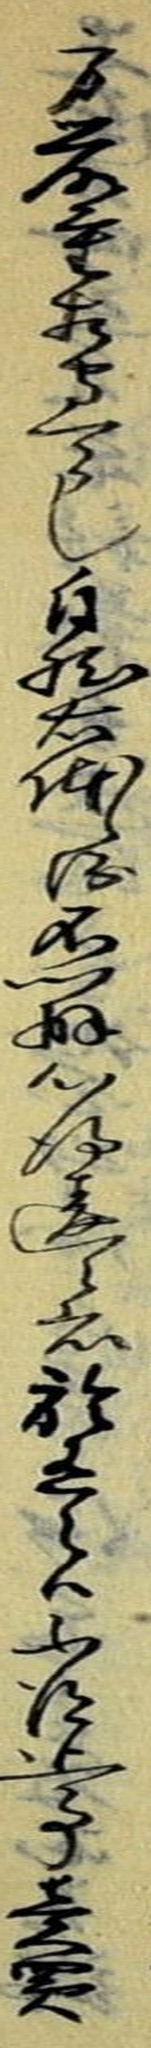方厳重相守可申候自然右体之儀不弁心得違之者於有之ハ不得止事売買
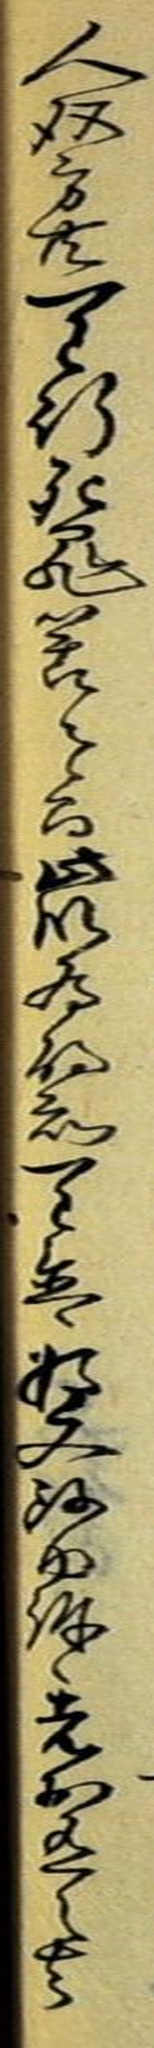人双方共可被行死罪筈ニ候間此段為触知可被置候将又致内訴候者於有之者
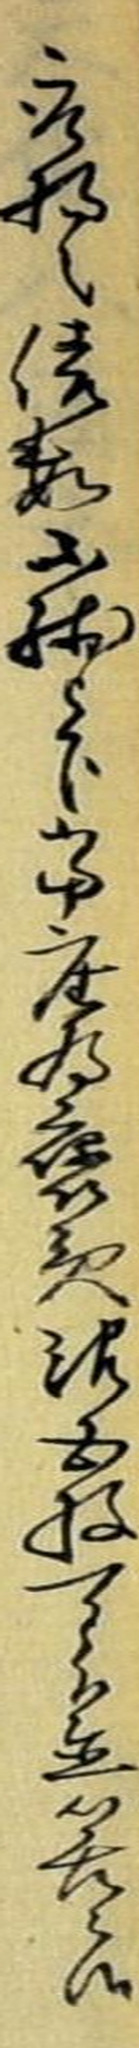取持之俵数不残被下当座為褒美銀五枚可被下置筈ニ候
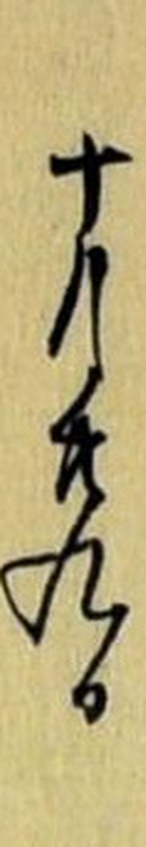十月廿九日
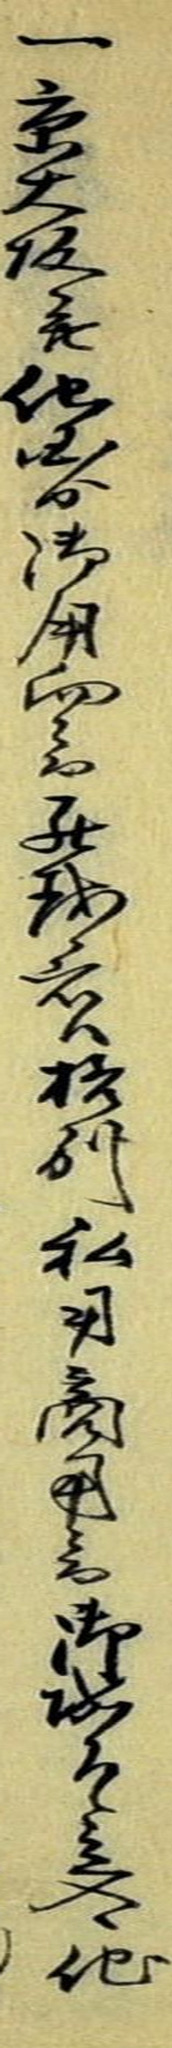一京大阪并他国ゟ御用向ニ而罷越候者ハ格別私用商用ニ而御城下立入候他
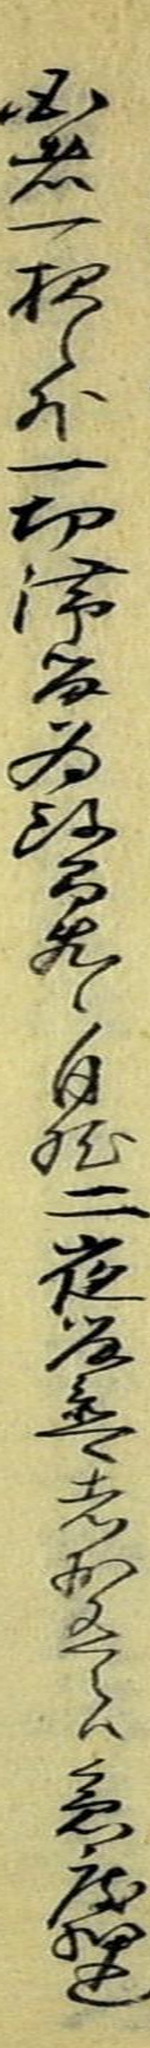国者一夜之外一切滞留為間敷候自然二夜留置候者於有之ハ急度押込
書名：命令之部 五
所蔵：福井県文書館 Fukui Prefectural Archives
